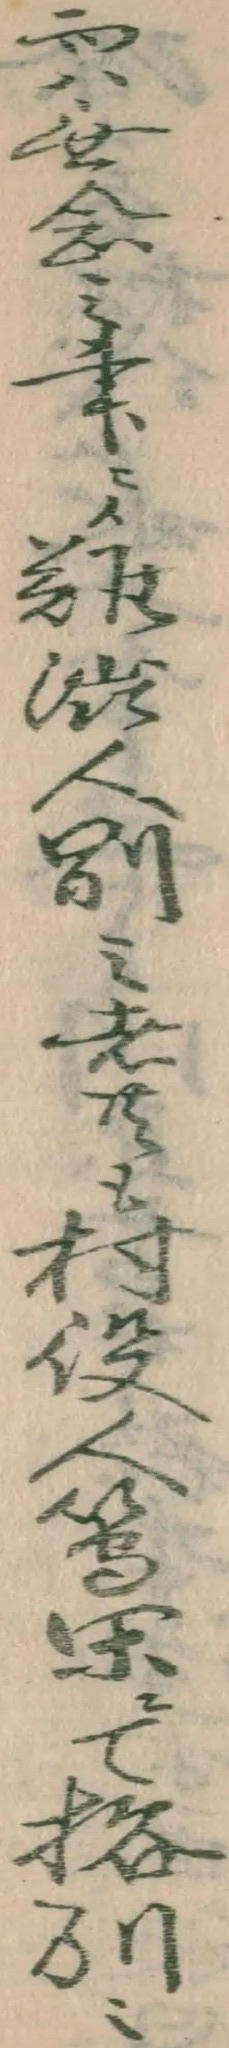而は無念之事ニ候難渋人別之者共も村役人等閑ニて格別之
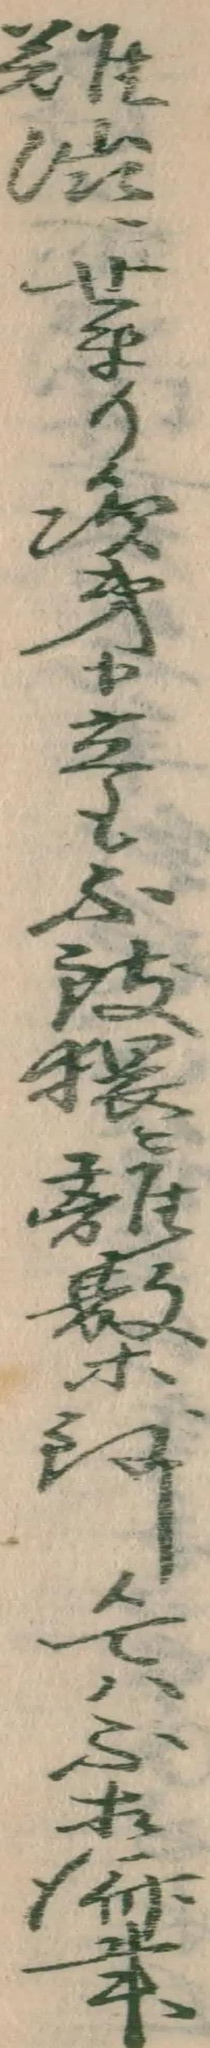難渋ニせまり候次第申立も不致猥ニ離散等致し候ては不相済事
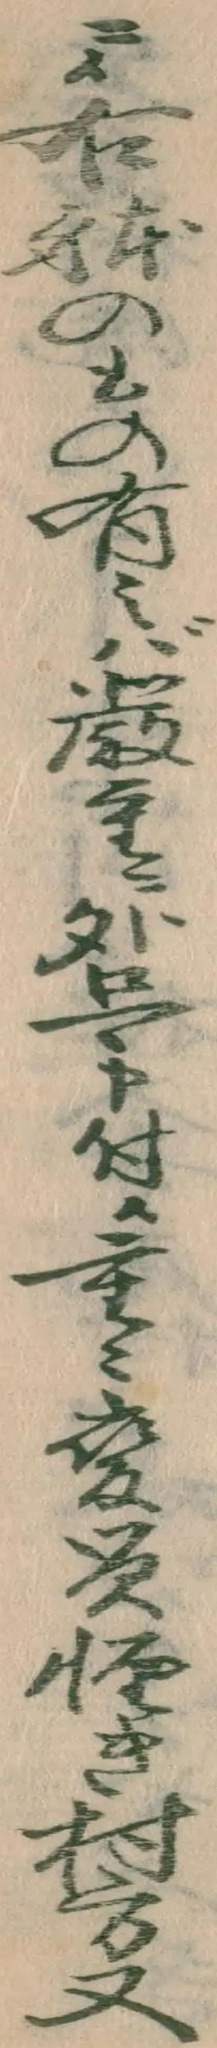ニ候右躰のもの有之ば厳重ニ咎可申付候重〻変災軽き村方又
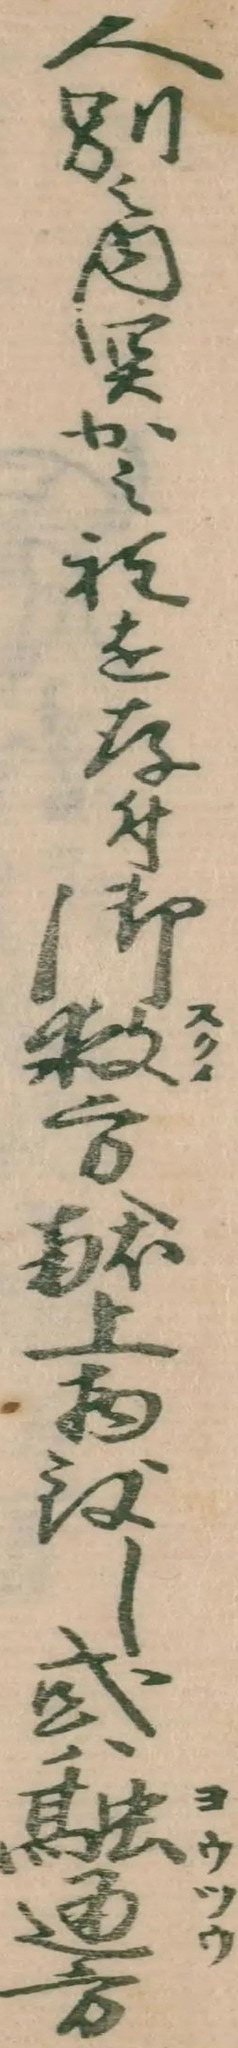人別之内関か之程を存付御救方へ献上物致し或は融通方
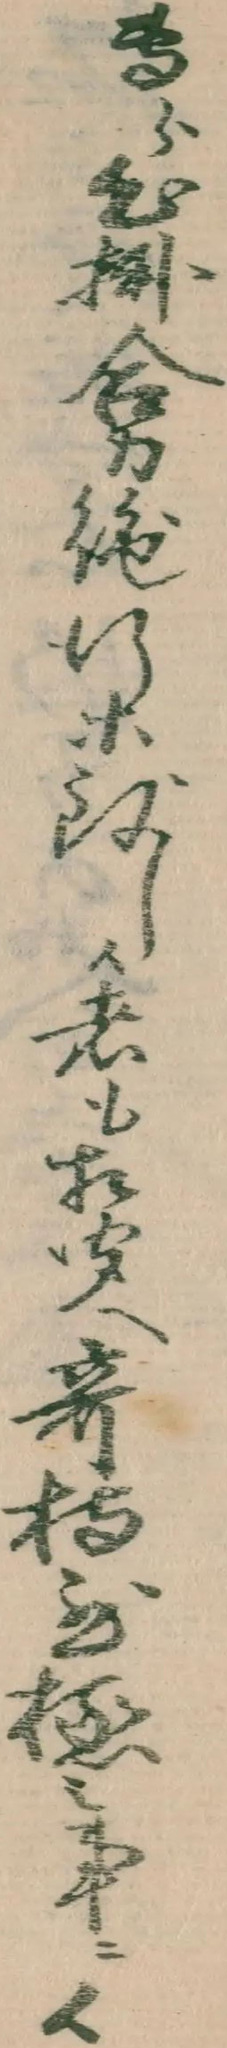専ら心掛合力施行等致し候者も相聞へ奇特至極之事ニ候
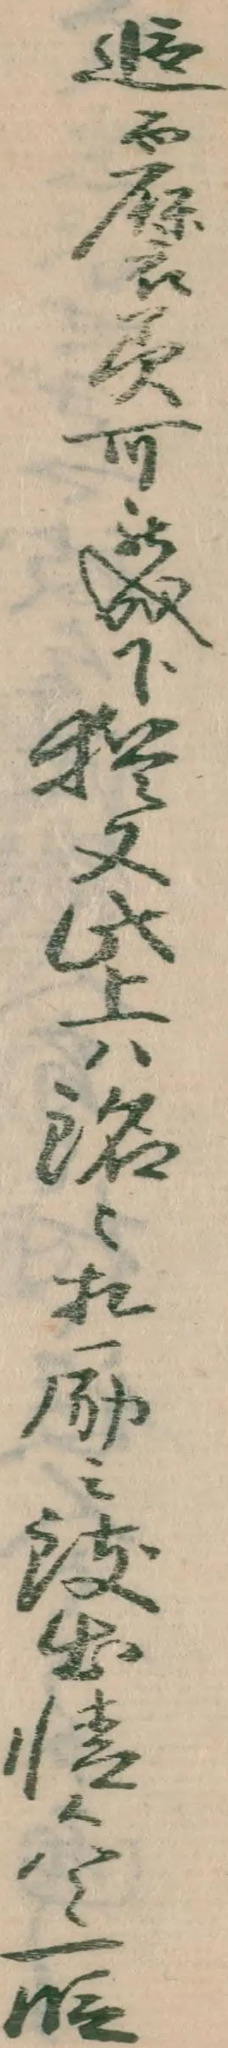追而褒美可被成下猶又此上は銘〻相励ミ致出精候はゝ一段
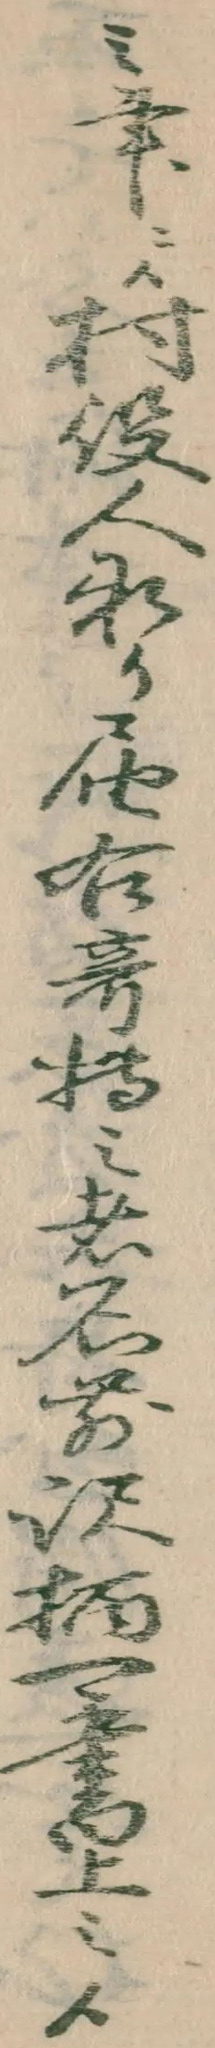之事ニ候村役人承り届右奇特之者名前訳柄可書上之候
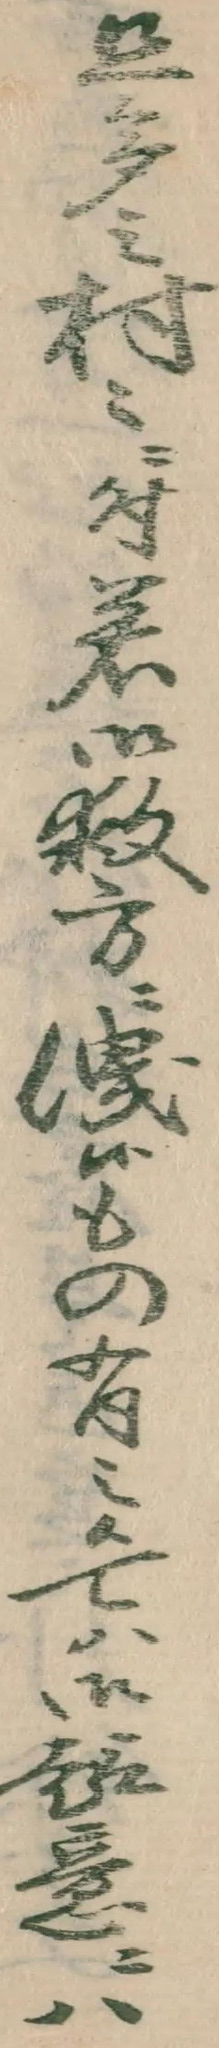只多之村〻ニ付若御救片ニ洩候もの有之候ては御趣意ニは
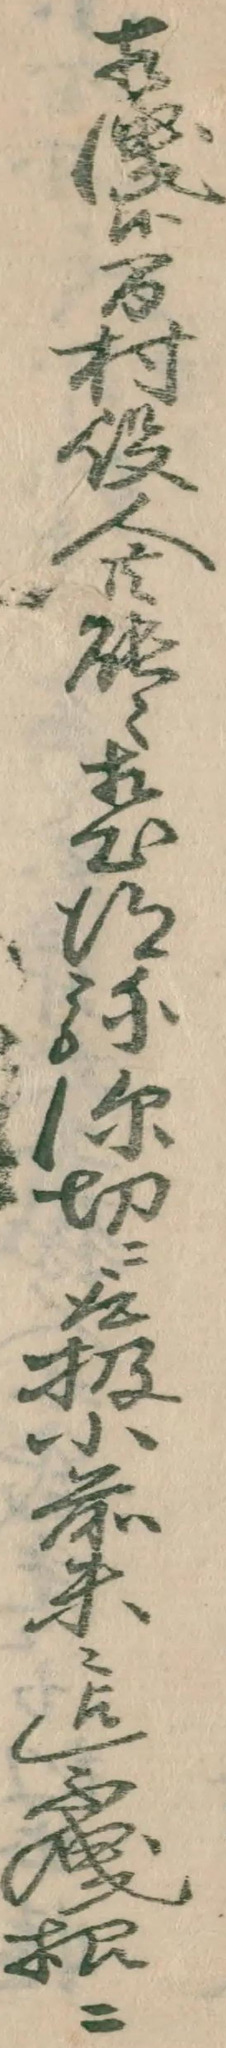相洩候間村役人共能〻相心得弥深切ニ取扱小前末〻迄不洩様ニ
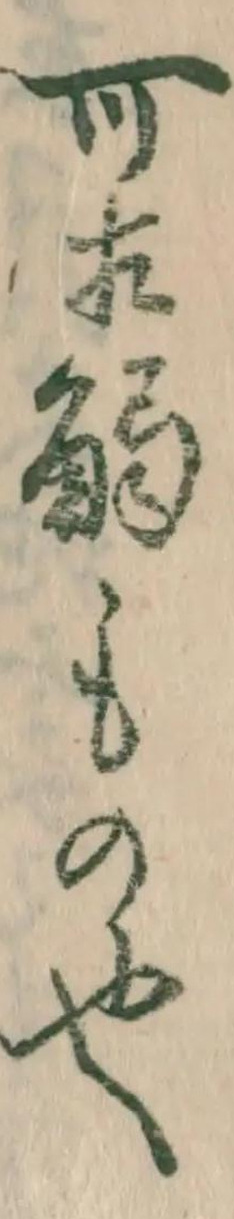可相触もの也
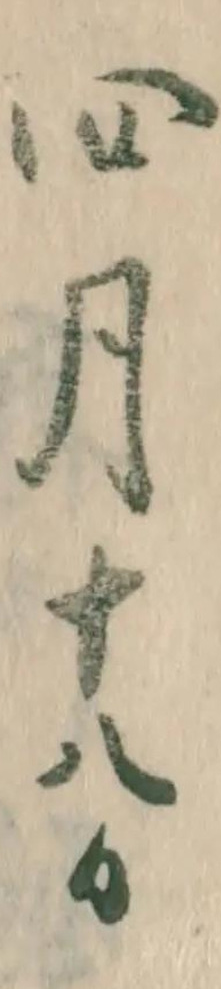四月十八日

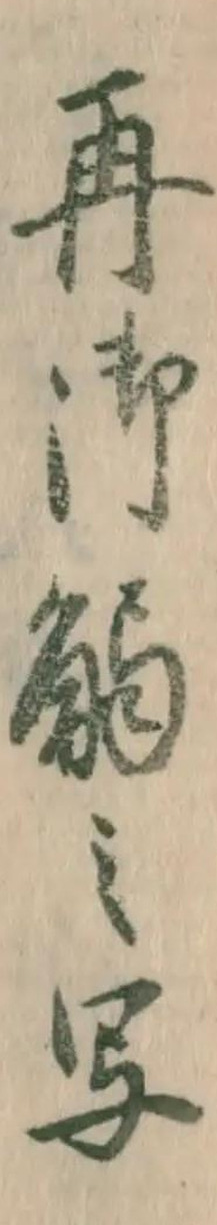再御触之写
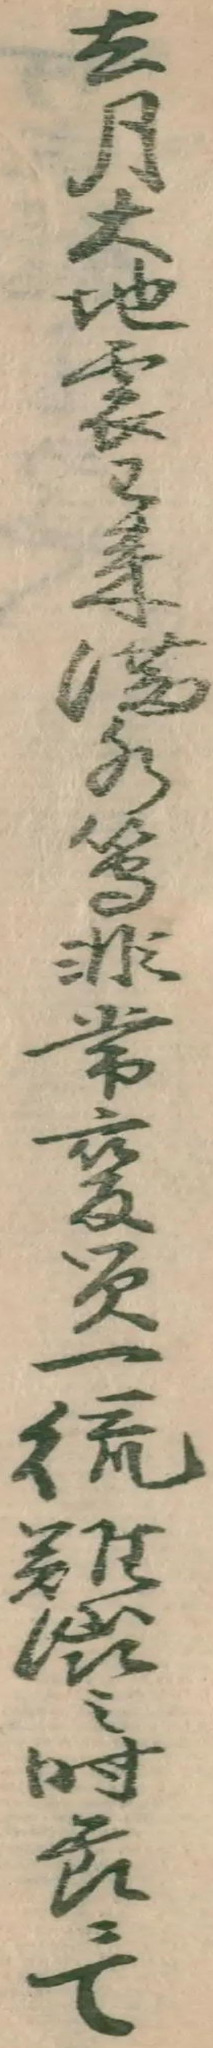去月大地震集已来満水等非常変災一統難渋之時節二て
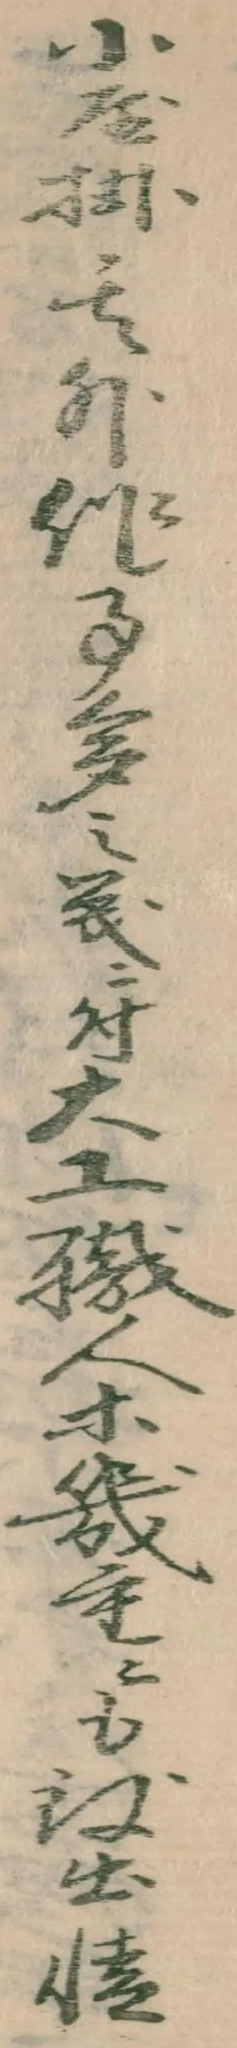小屋掛其外作事多之義二付大工職人等幾重二も致出精
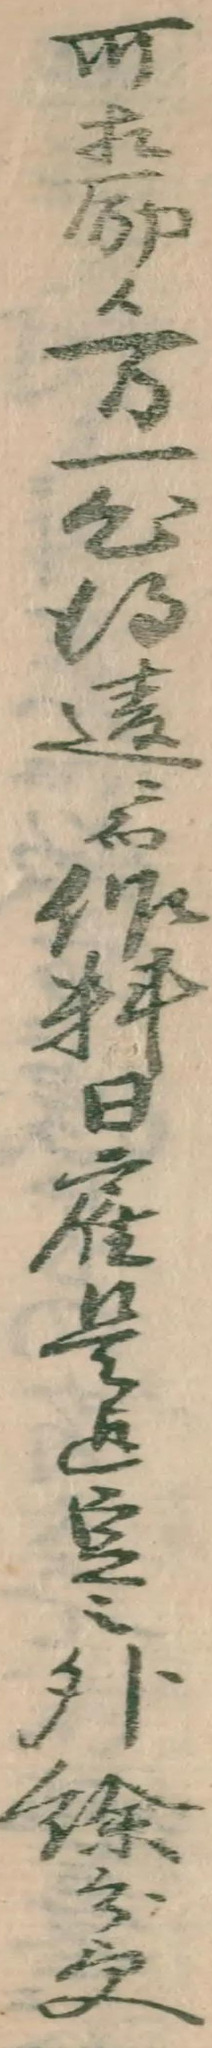可相励候万一心得違二而作料日雇是迄定之外余分受
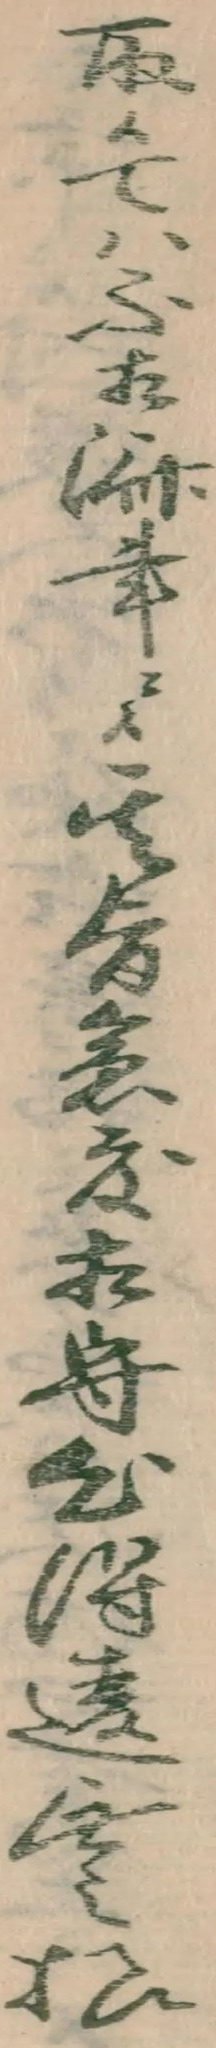取二てハ不相済事二候其旨急度相守心得違無之様
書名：大地震
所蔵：国立国会図書館 National Diet Library, JAPAN
